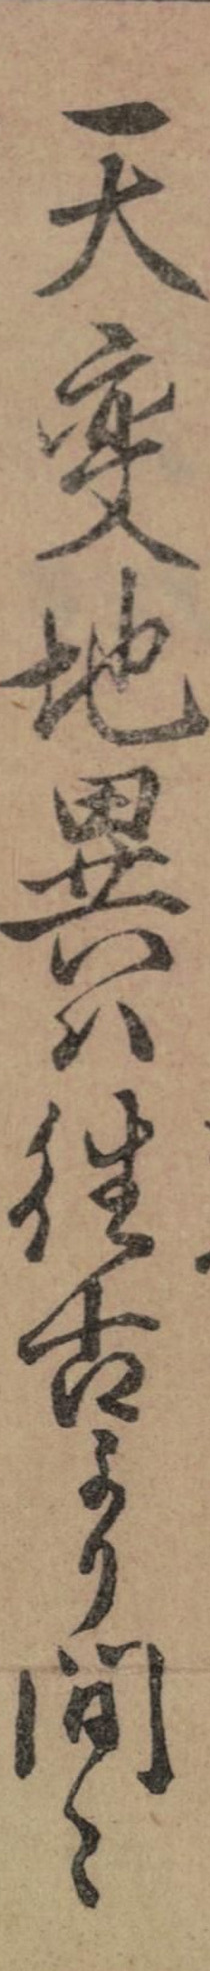天変地異は往古より間〻
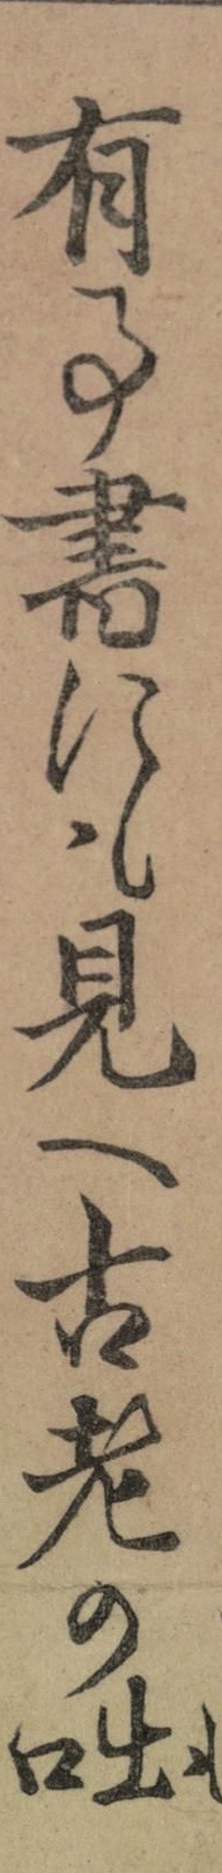有事書にも見へ古老の咄
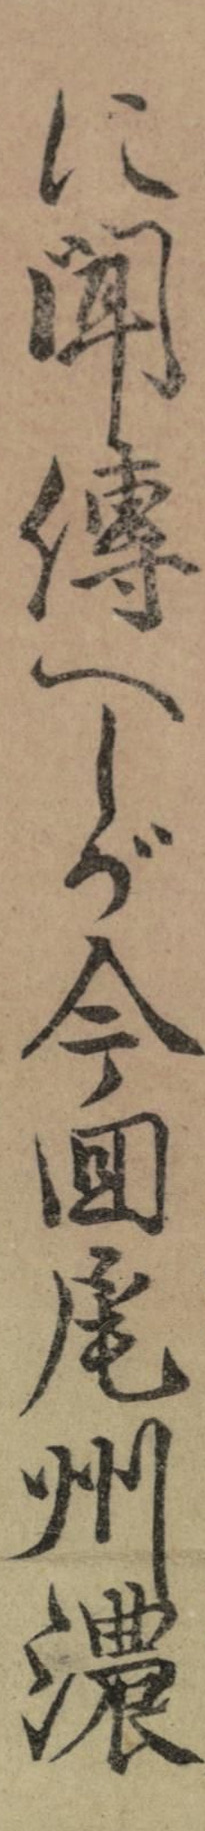に聞伝へしが今回尾州濃
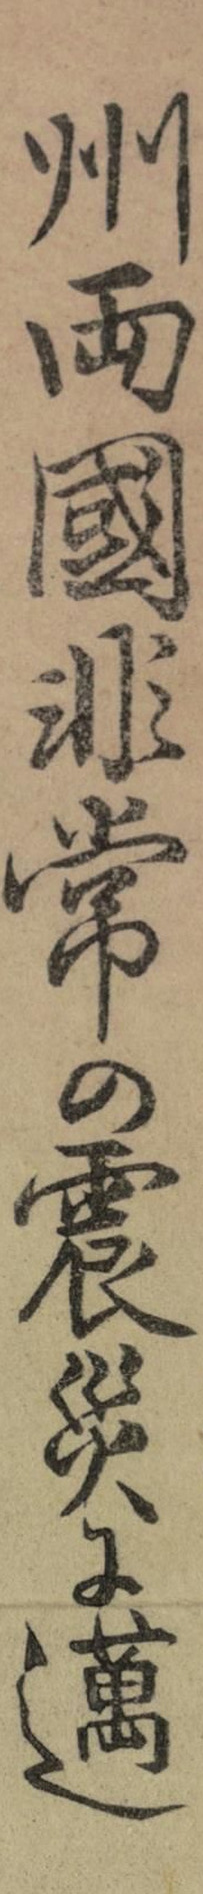州両国非常の震災に遭
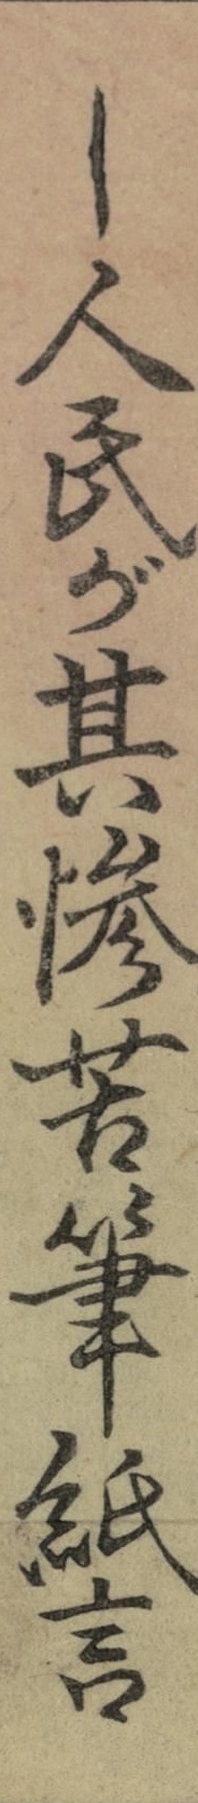し人民が其惨区筆紙言
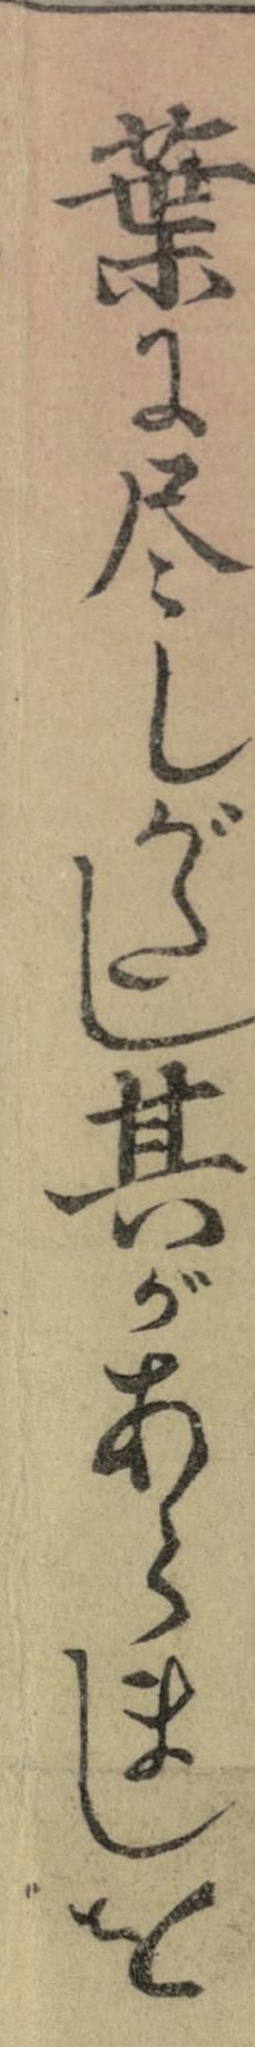葉に尽しがたし其があらましを
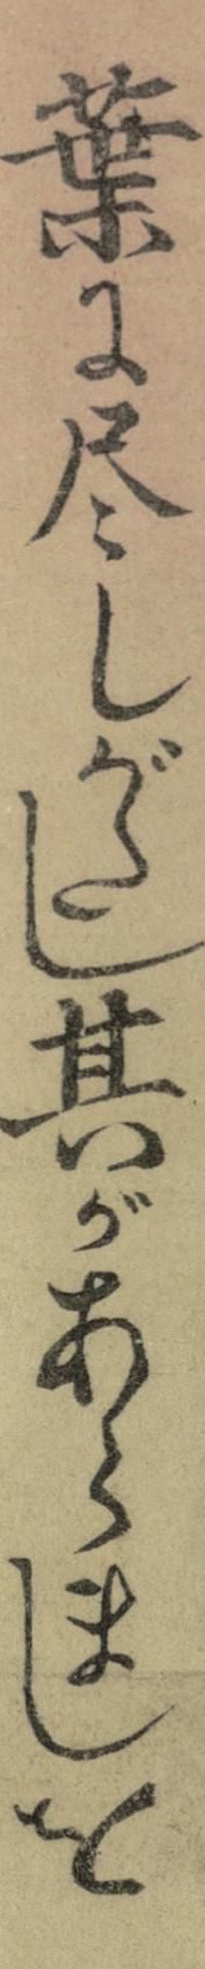葉に尽しがたし其があらましを
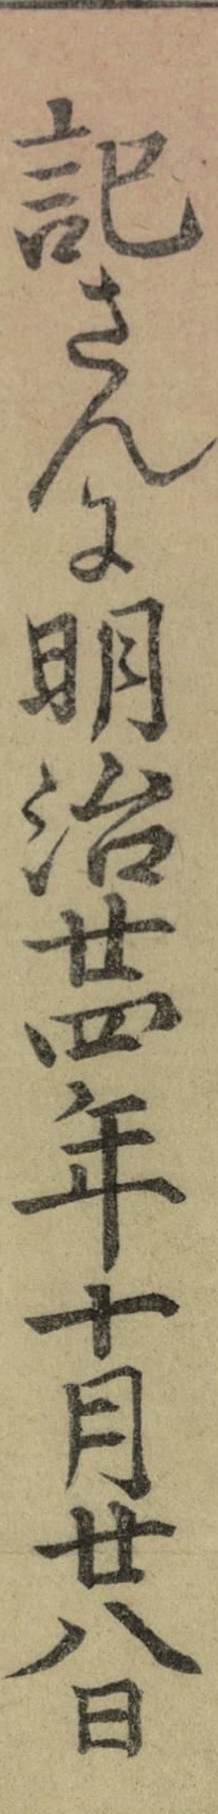記さんに明治廿四年十月廿八日
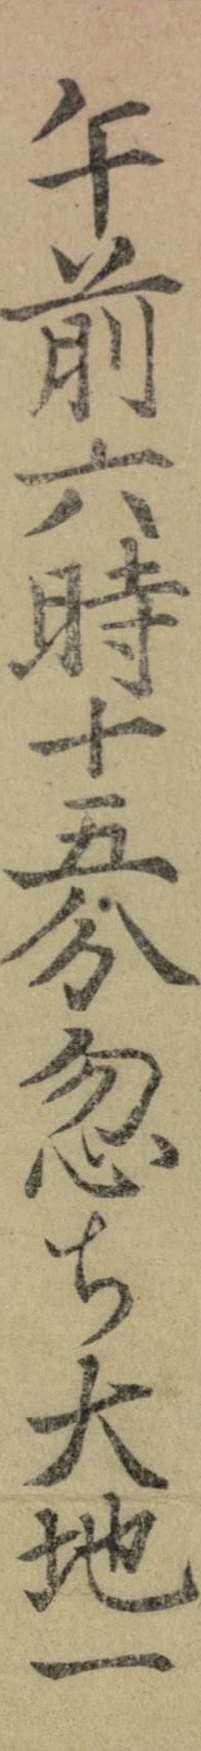午前六時十五分忽ち大地一
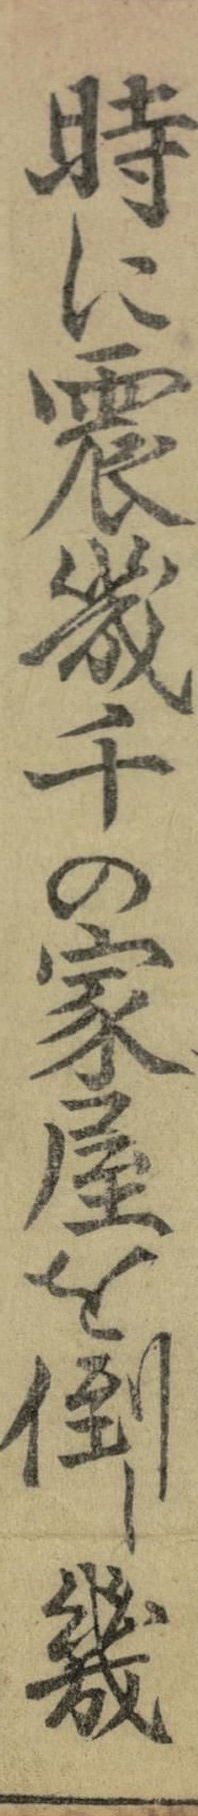時に震幾千の家屋を倒し幾
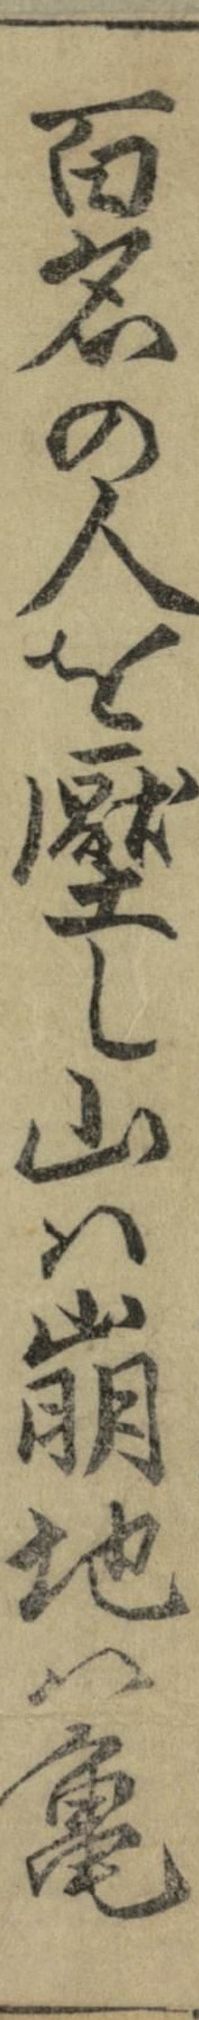百名の人を圧し山は崩地
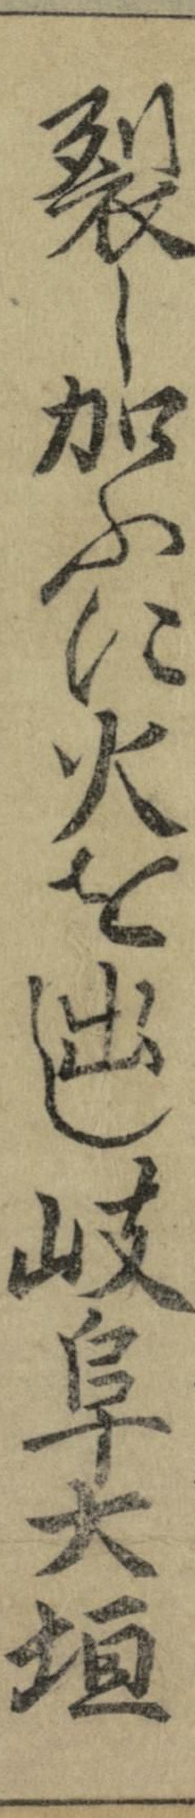裂し加ふに火を出し岐阜大垣
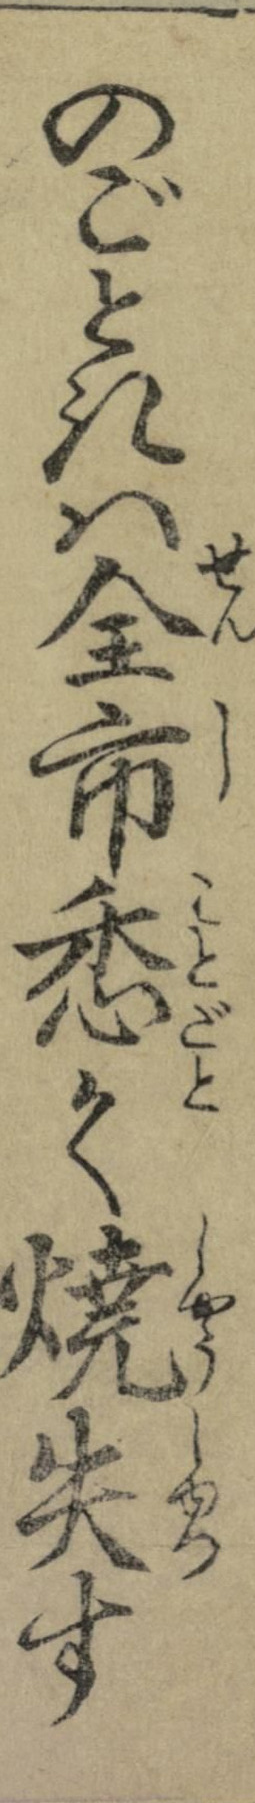のごときは全市悉く焼失す
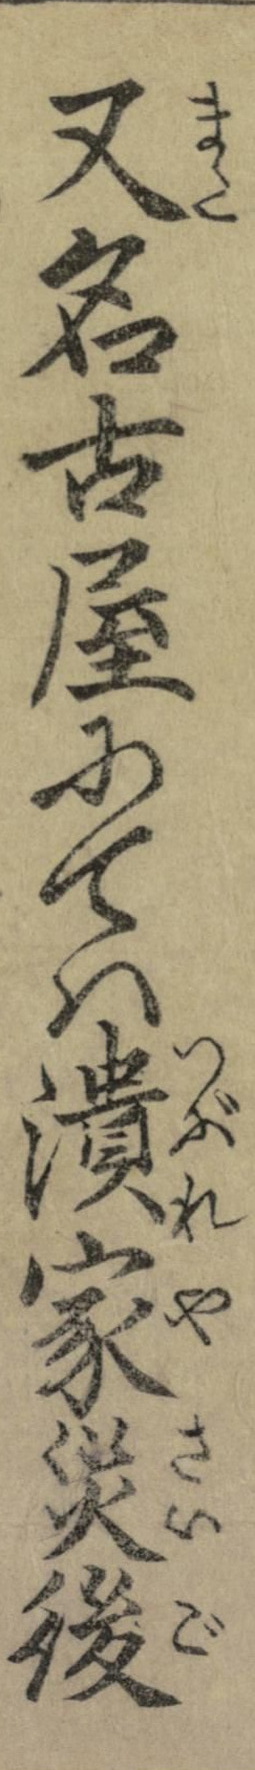又名古屋にては潰家災後
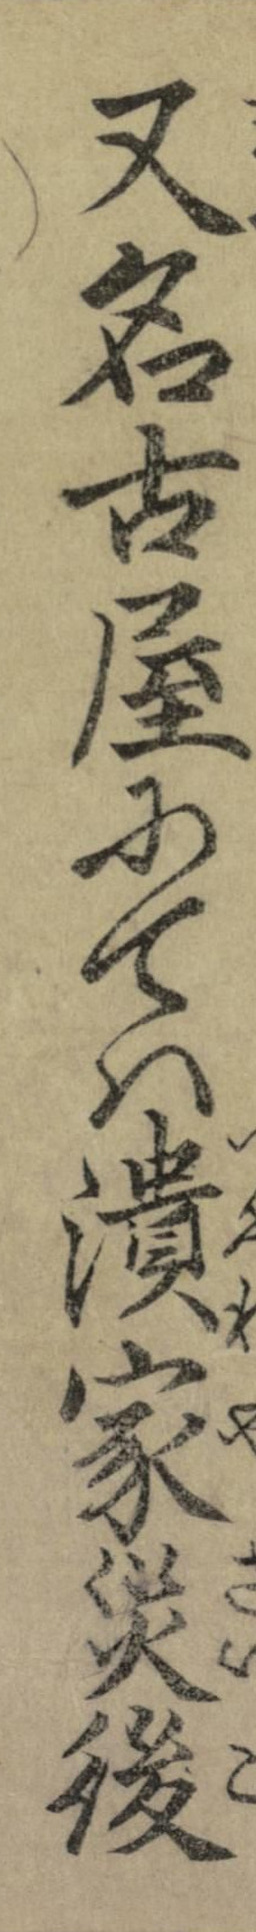又名古屋にては潰家災後
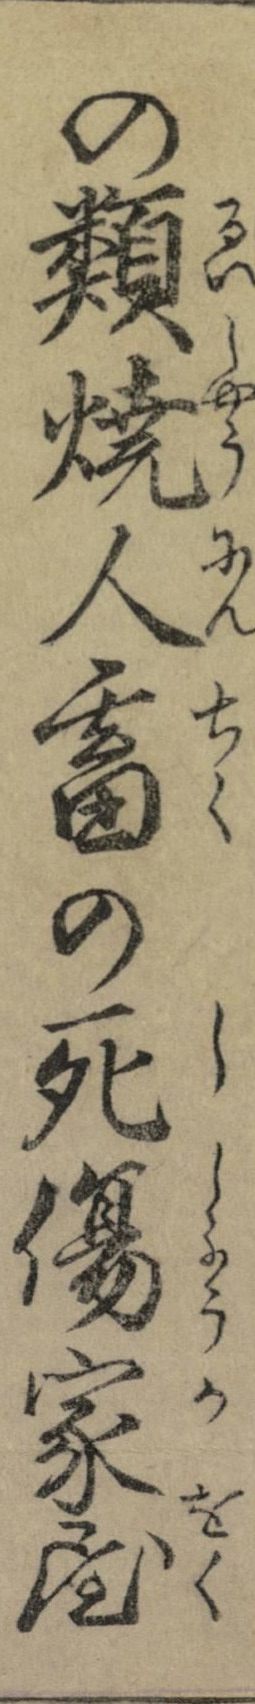の類焼人畜の死傷家屋
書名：岐阜縣・愛知縣　大地震實況
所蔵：東京大学地震研究所図書室 Earthquake Research Institute Library, The University of Tokyo, JAPAN
